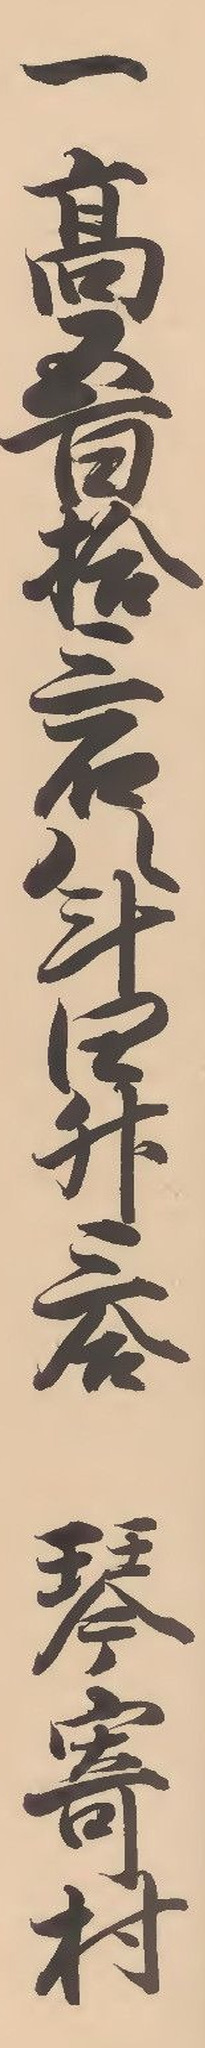一高五百拾三石八斗四升三合琴寄村
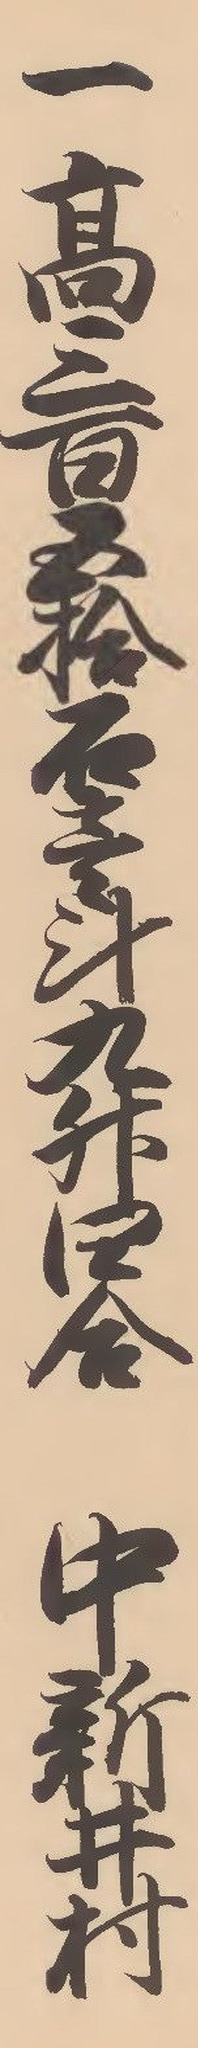一高三百五拾石壱斗九升四合中新井村
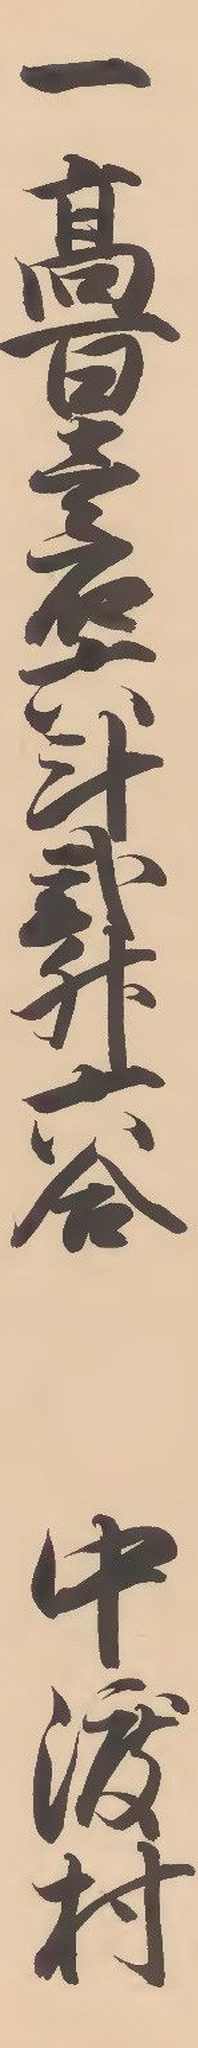一高百壱石六斗弐六合中渡村
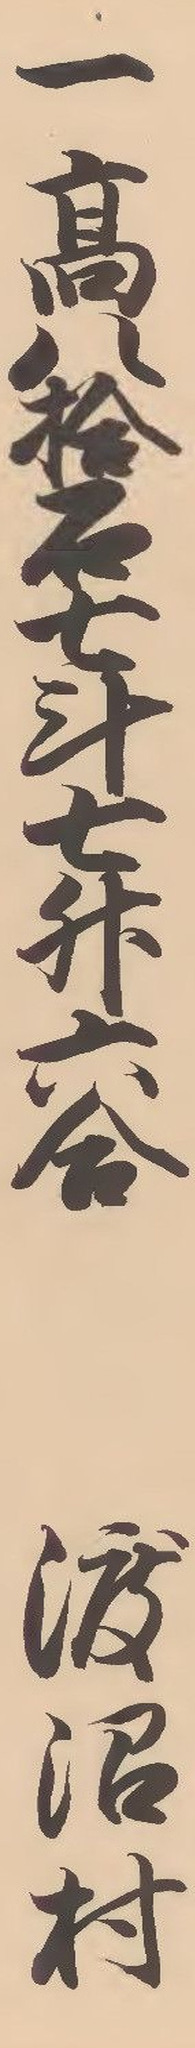一高八拾石七斗七升六合渡沼村

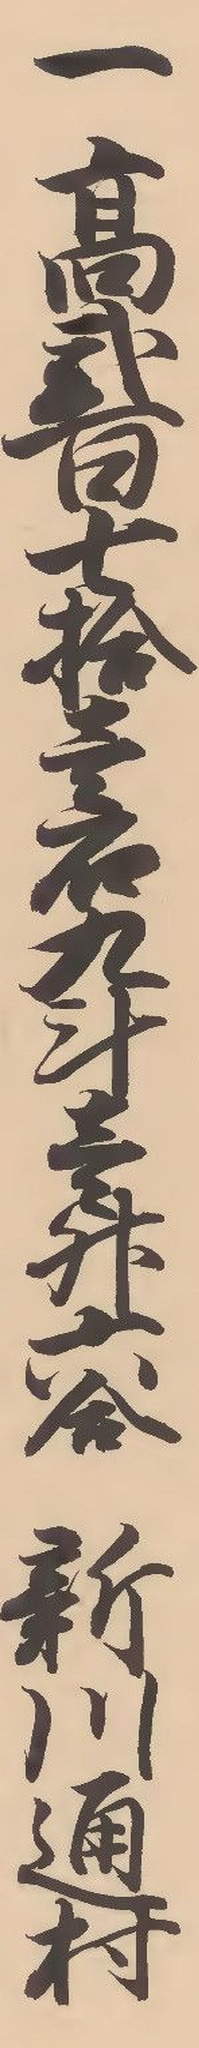一高弐百七拾壱石九斗壱升六合新川通村
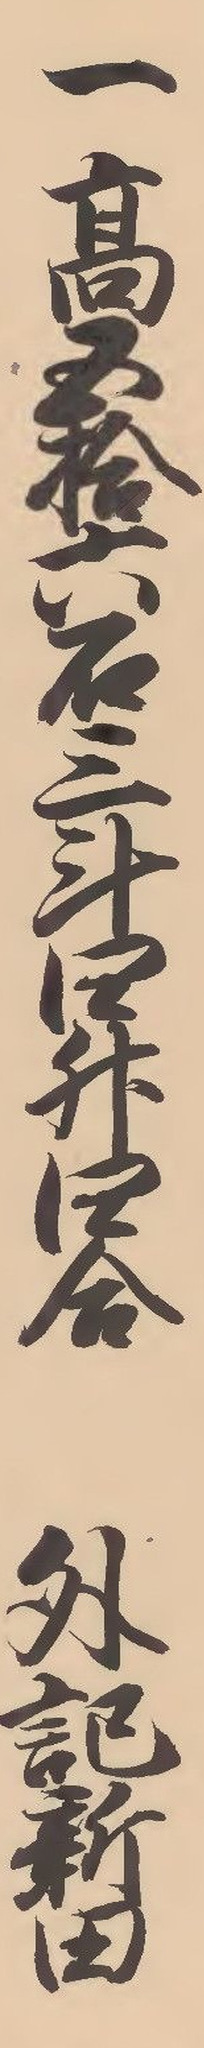一高五拾六石三斗四升四合外記新田
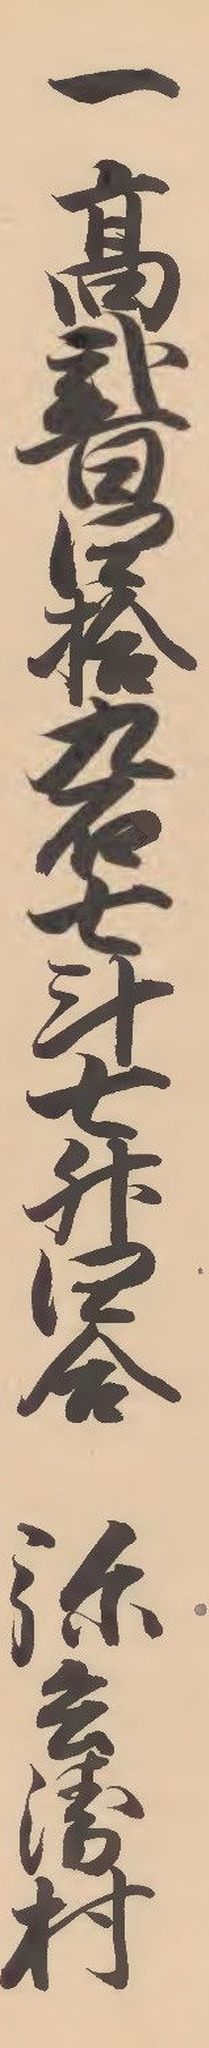一高弐百四拾九石七斗七升四合弥兵衛村
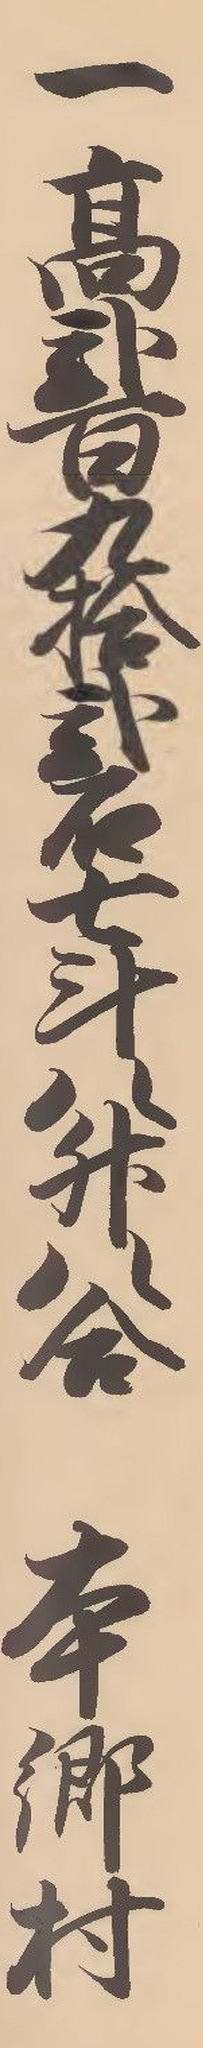一高弐百九拾弐石七斗八升八合本郷村
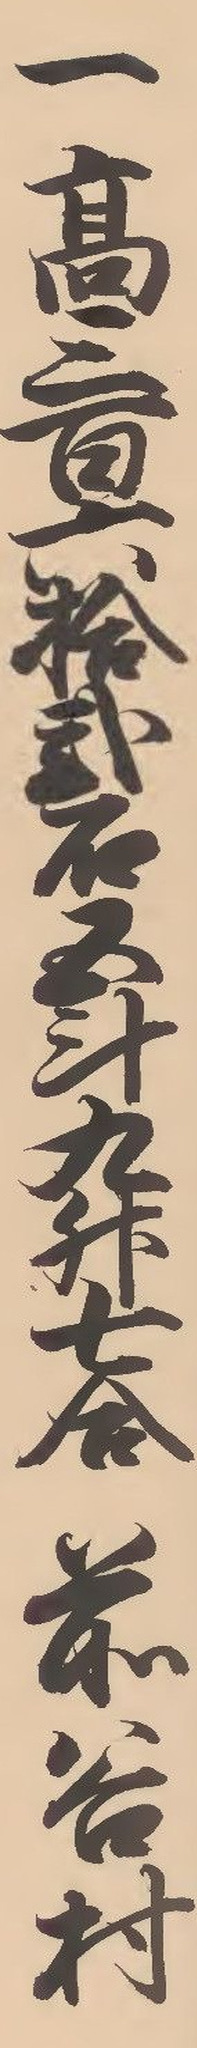一高三百六拾弐石五斗九升七合前谷村
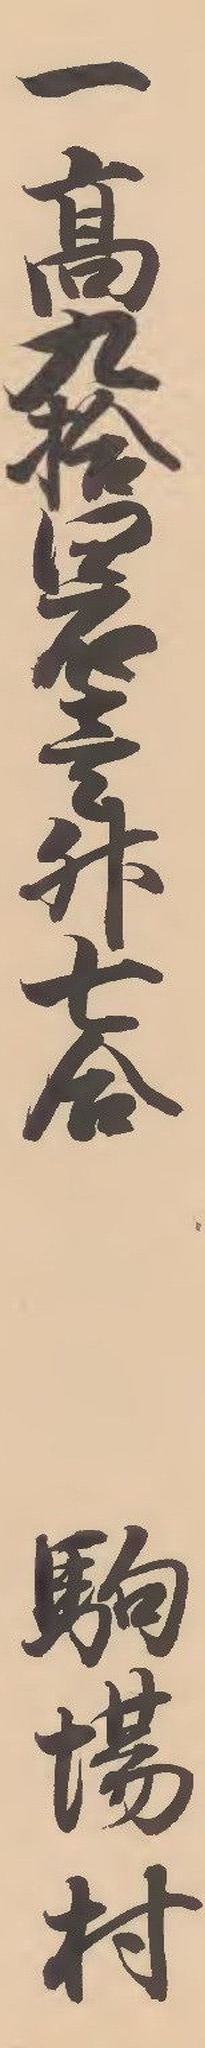一高九拾四石壱升七合駒場村
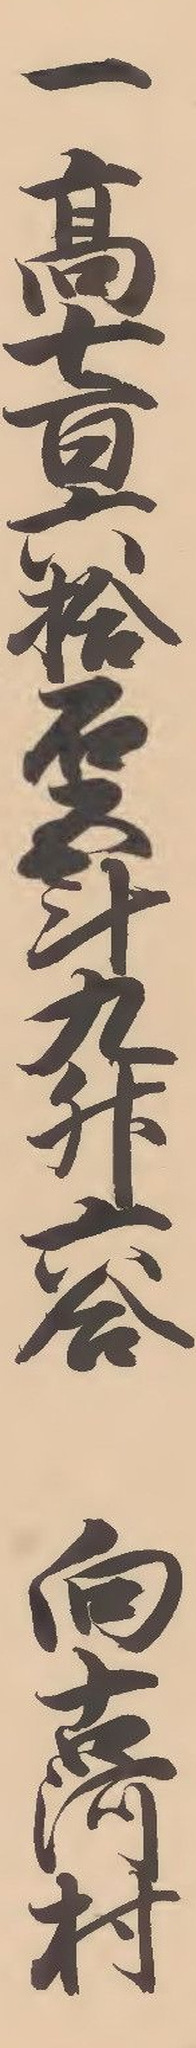一高七百六拾石五斗九升六合向古河村
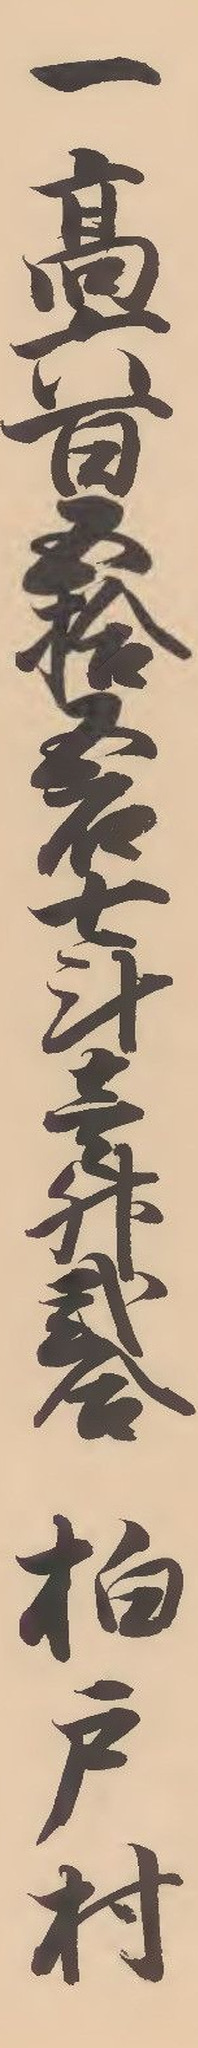一高六百五拾五石七斗壱升弐合柏戸村

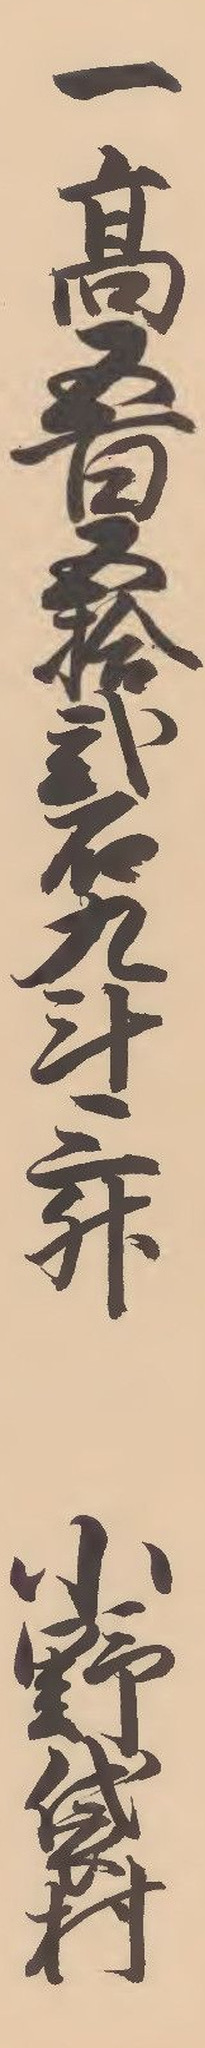一高五百五拾弐石九斗三升小野袋村
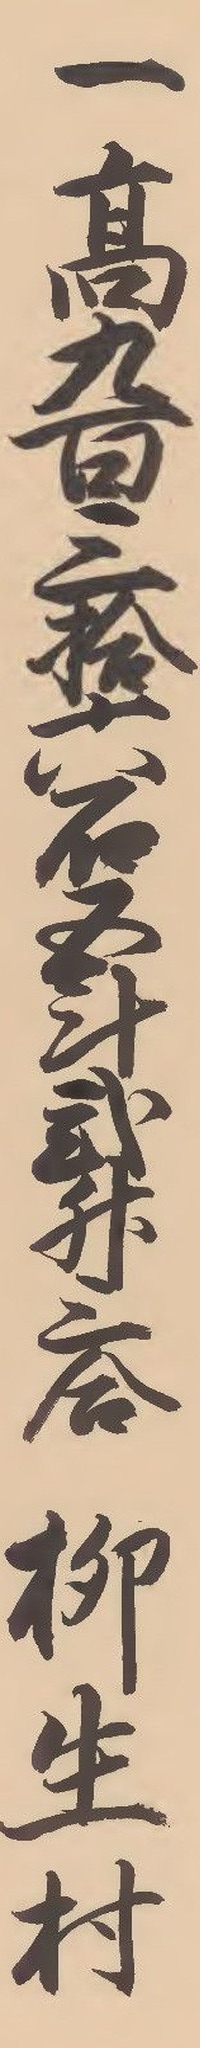一高九百三拾六石五斗弐升三合柳生村
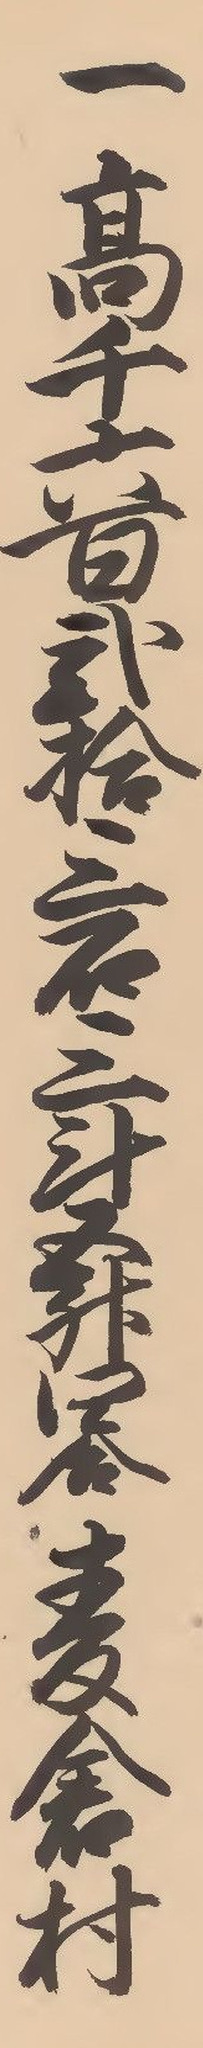一高千六百弐拾三石三斗五升四合麦倉村
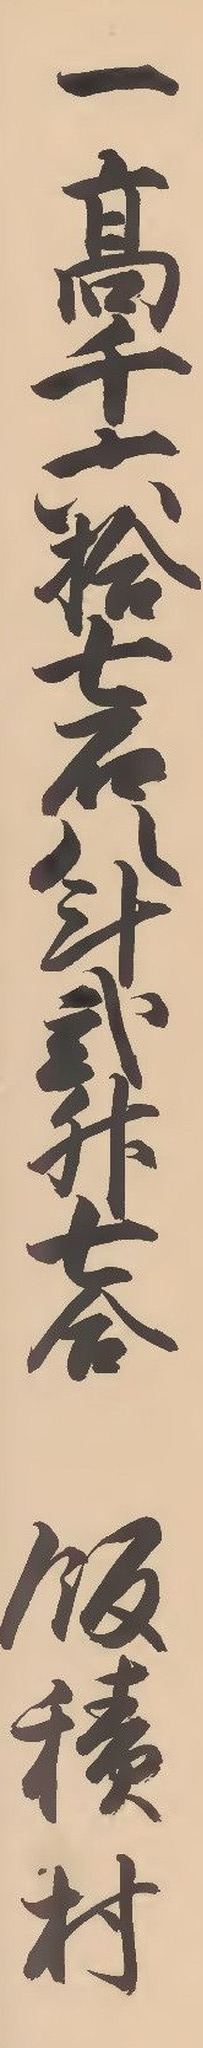一高千六拾七石八斗弐升七合飯積村
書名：武蔵国郷帳　下
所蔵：国立公文書館 National Archives of Japan
